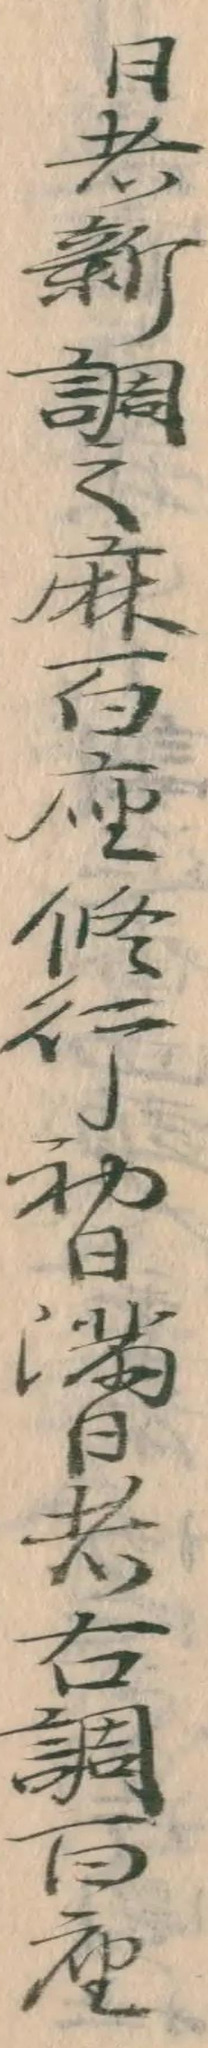日者新調之麻百座修行初日満日者古調百座
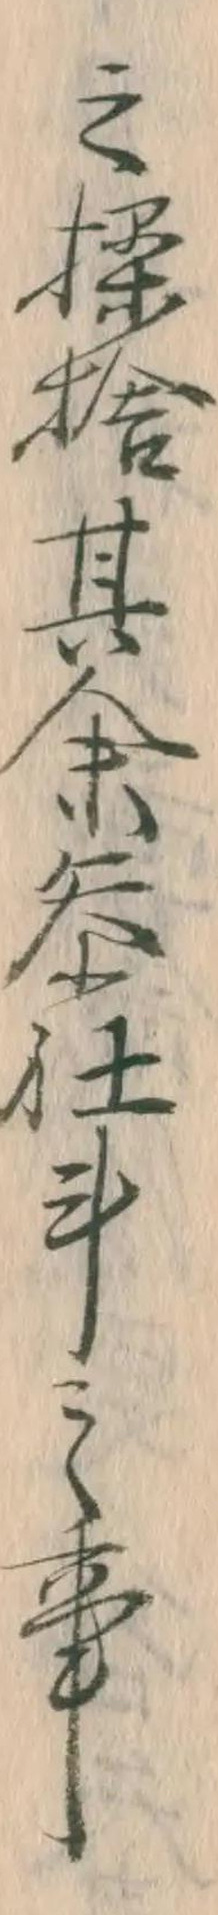之繰捨其余参社斗之事
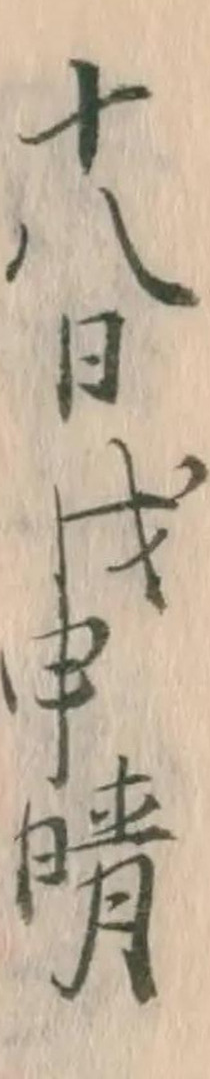十八日戊申晴
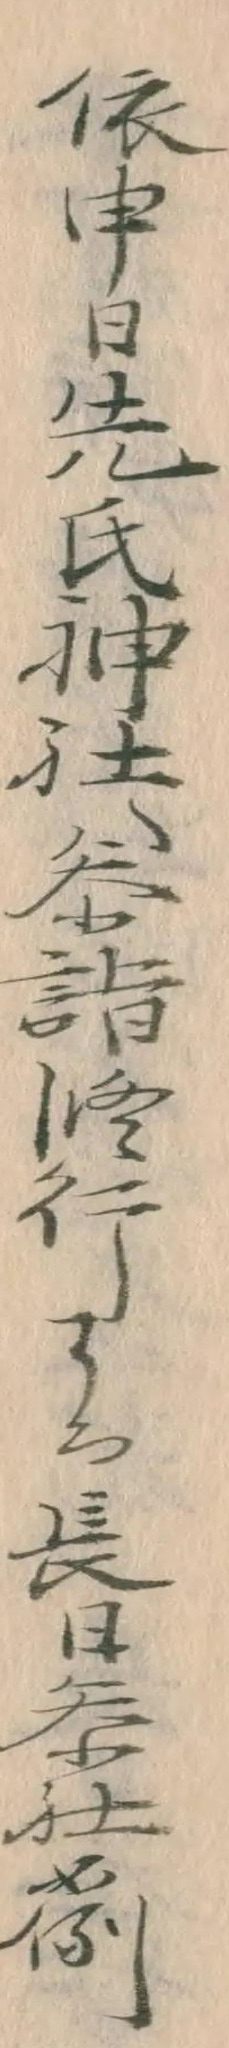一依申日先氏神社へ参詣修行終了而長日参社如例
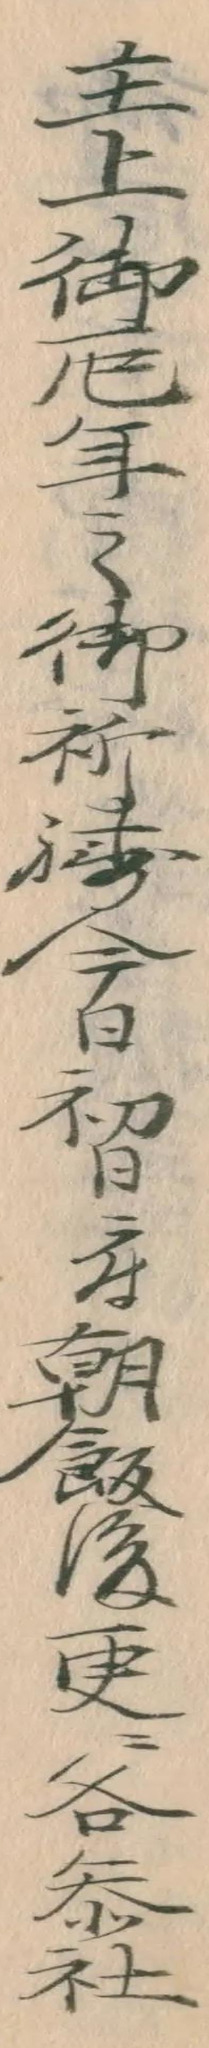一主上御厄年之御祈祷今日初日ニ付朝飯後更ニ各参社
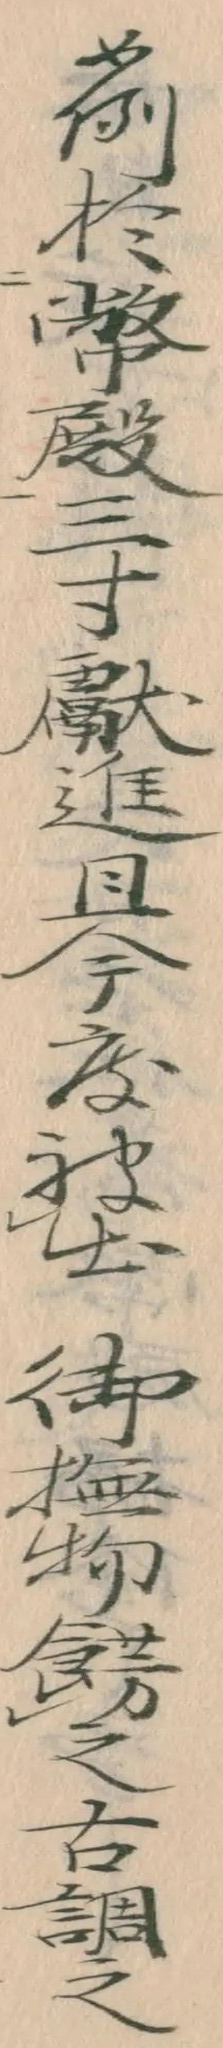如例於幣殿三寸献進且今度被出御撫物餝之古調之
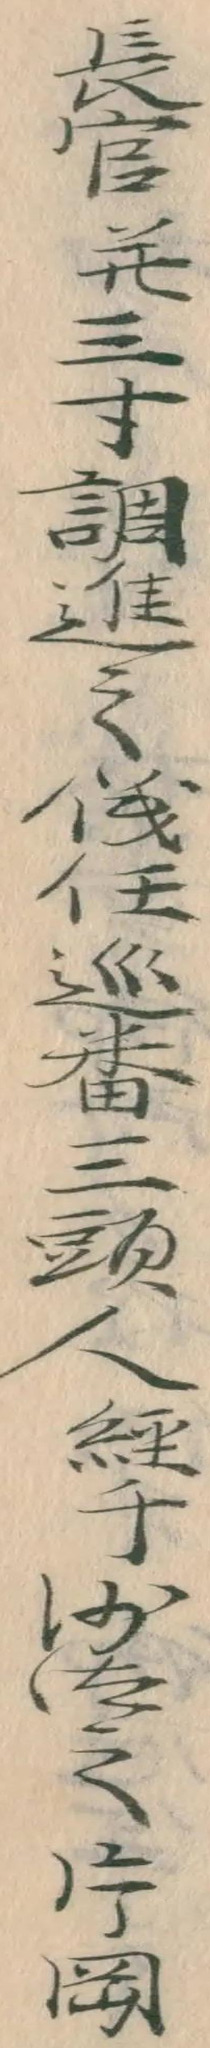長官并三寸調進之儀任巡番三頭人経千沙汰之片岡
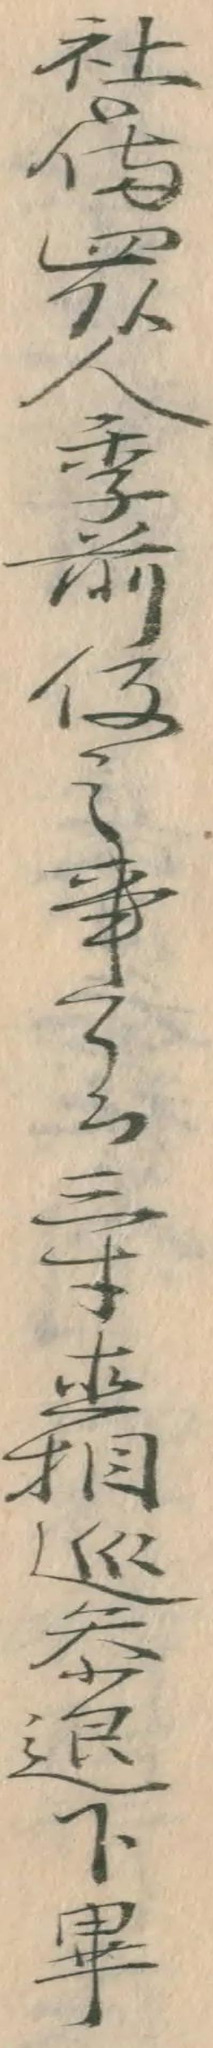社御備四頭人季前役之事了而三寸直相巡参退下畢

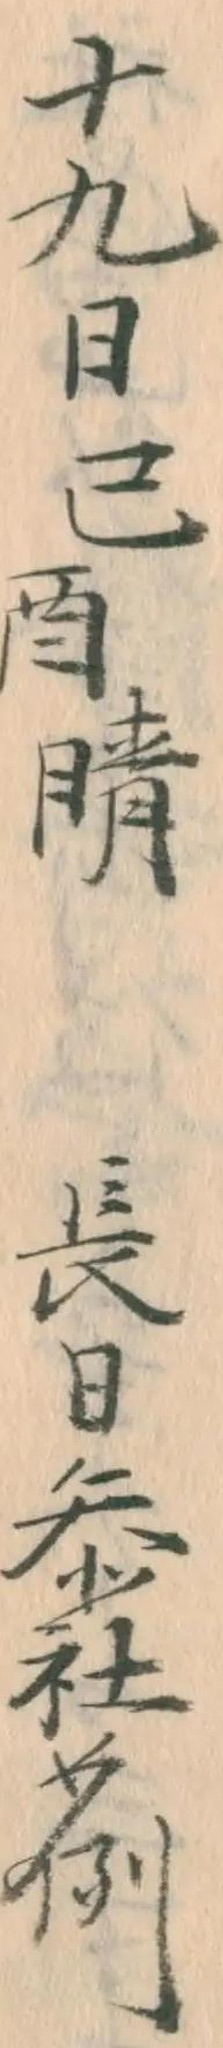十九日己酉晴長日参社如例
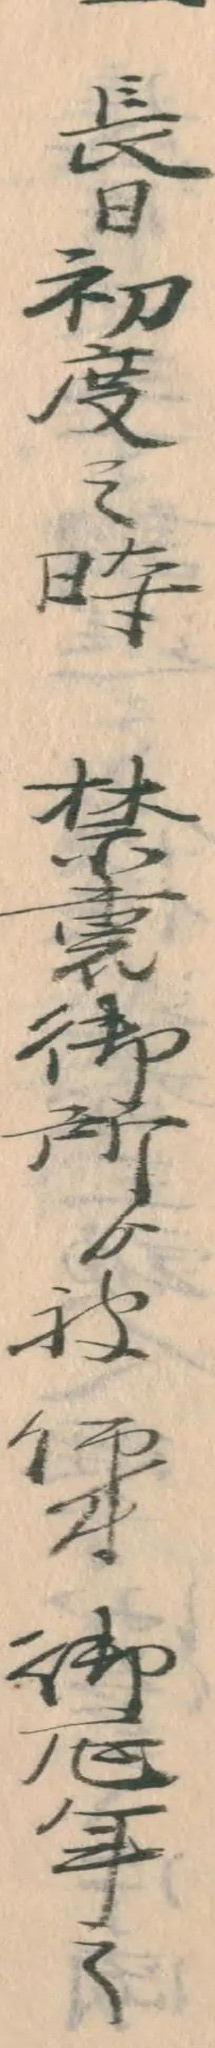一長日初度之時禁裏御所ゟ被仰付御厄年之
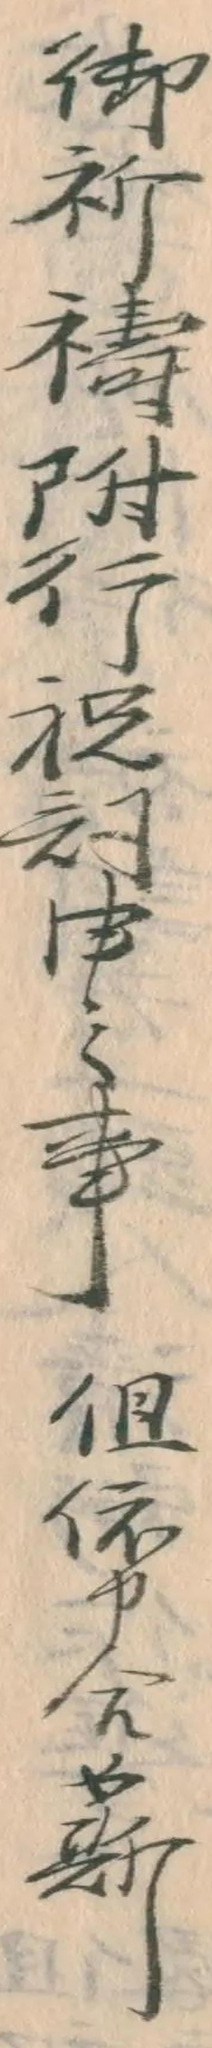御祈祷附行祝詞申之事但依申合如斯
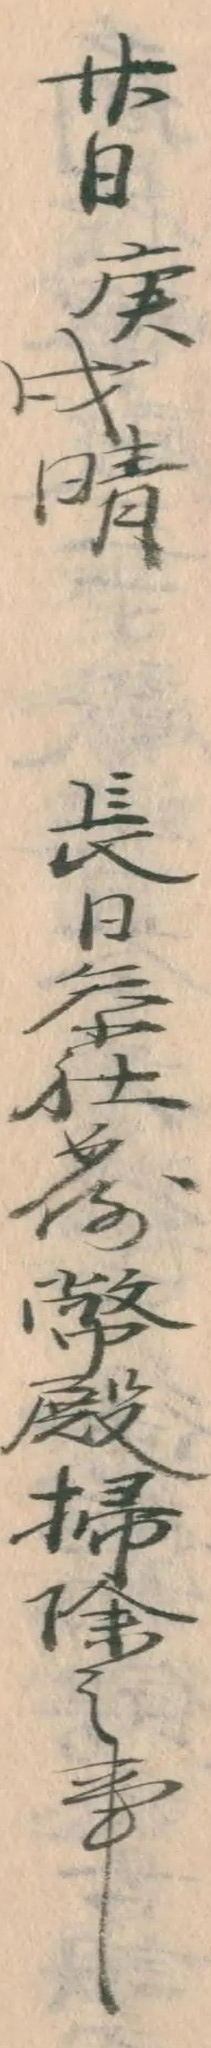廿日庚戌晴長日参社如例幣殿掃除之事
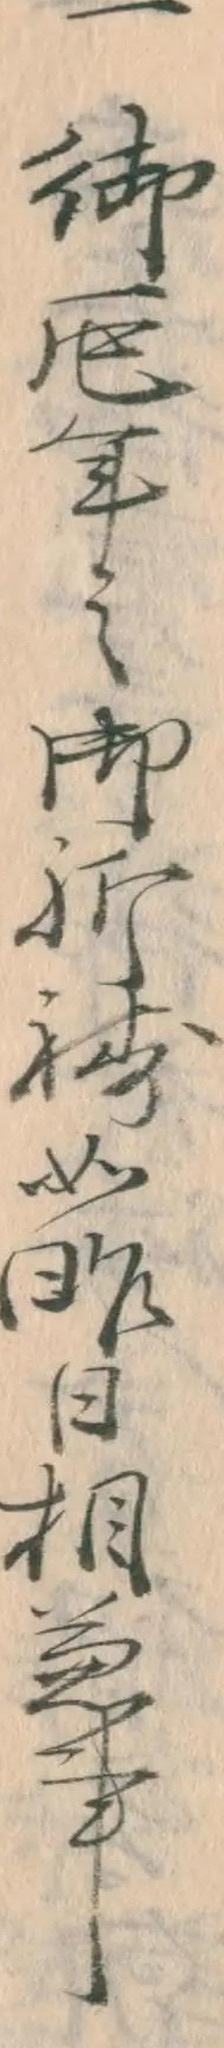一御厄年之御祈祷如昨日相兼事
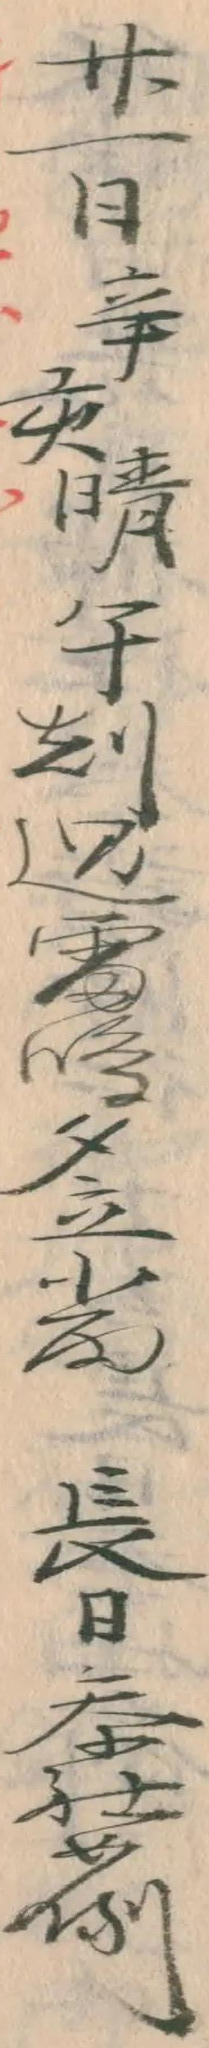廿一日辛亥晴午刻過雷鳴夕立小雨長日参社如例
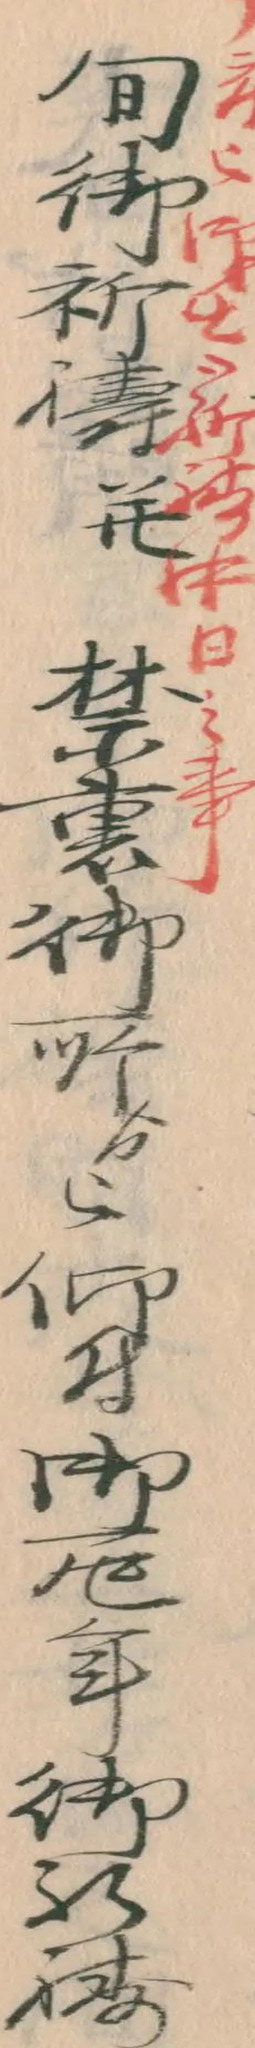一旬御祈祷并禁裏御所ゟ被仰付御厄年御祈祷
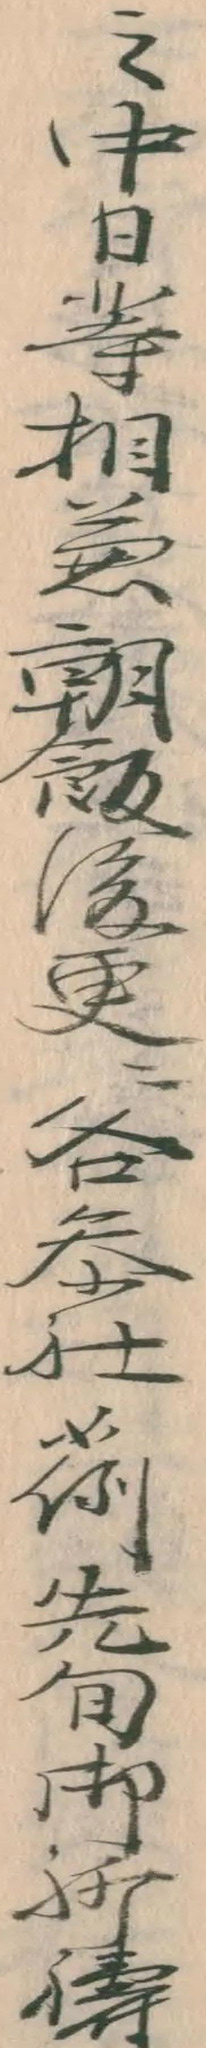之中日等相兼朝飯後更ニ各参社如例先旬御祈祷
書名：賀茂社記録. 第73冊
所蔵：国立国会図書館 National Diet Library, JAPAN
